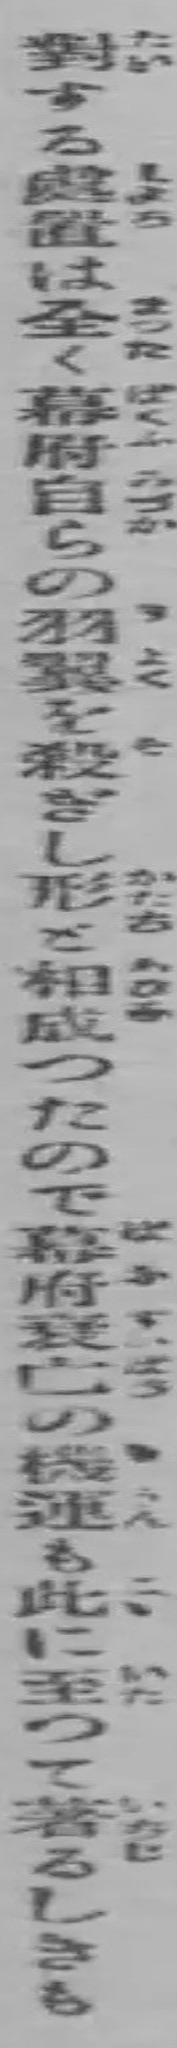対する処置は全く幕府自らの羽翼を殺ぎし形と相成つたので幕府衰亡の機運も此に至つて著るしきも

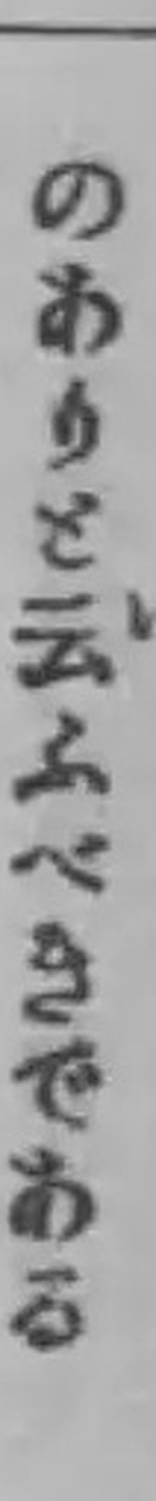のありと云ふべきである
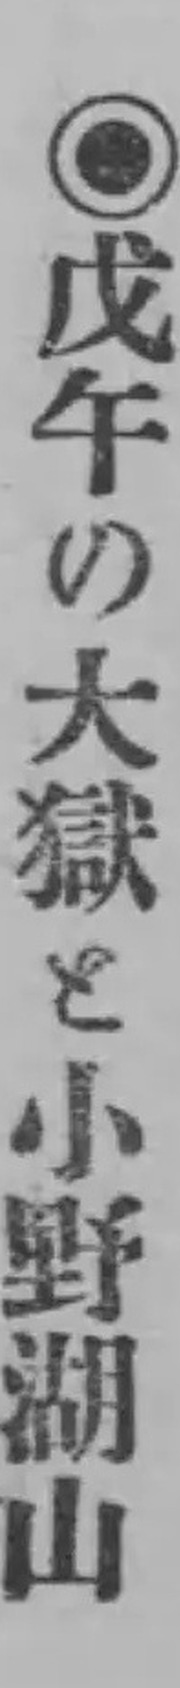◉戊午の大獄と小野湖山
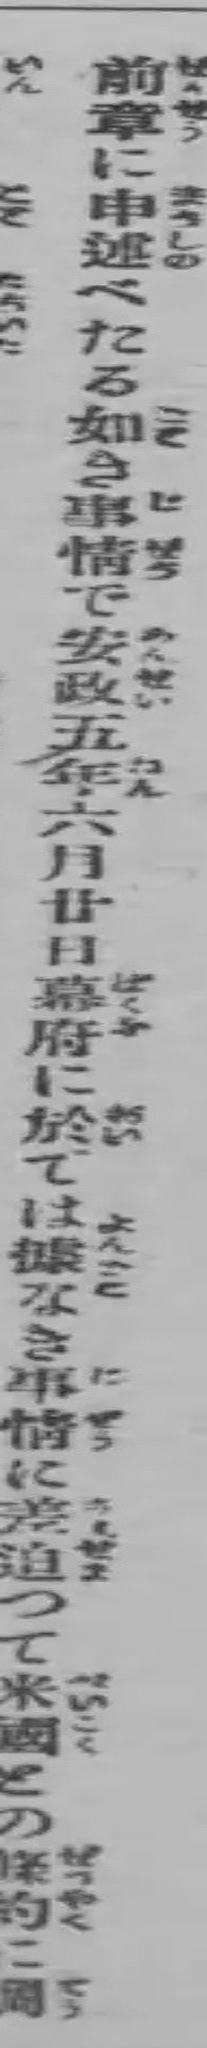前章に申述べたる如き事情で安政五年六月廿日幕府に於て拠なき事情に差迫つて米国との条約に調
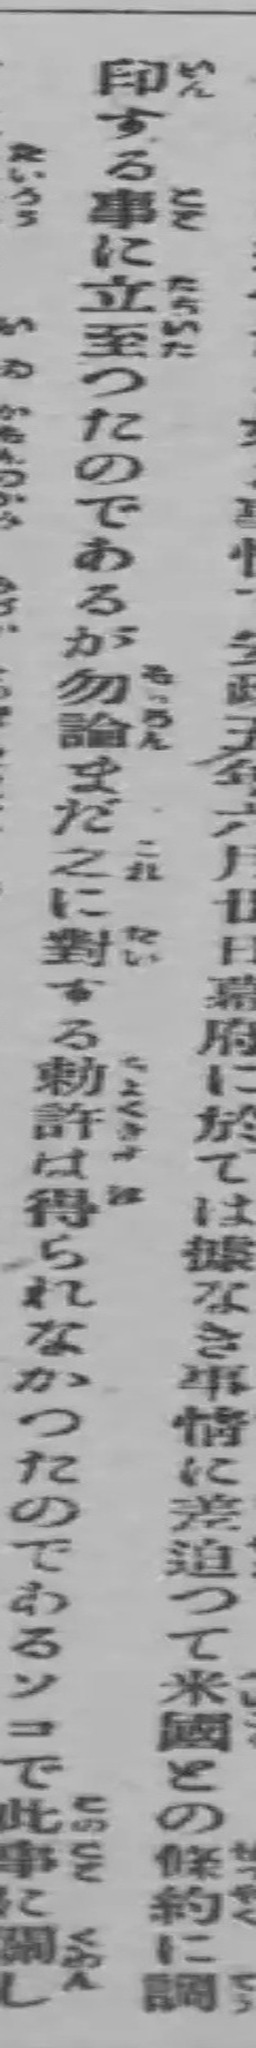印する事に立至つたのであるが勿論まだ之に対する勅許は得られなかつたのであるソコで此事に関し
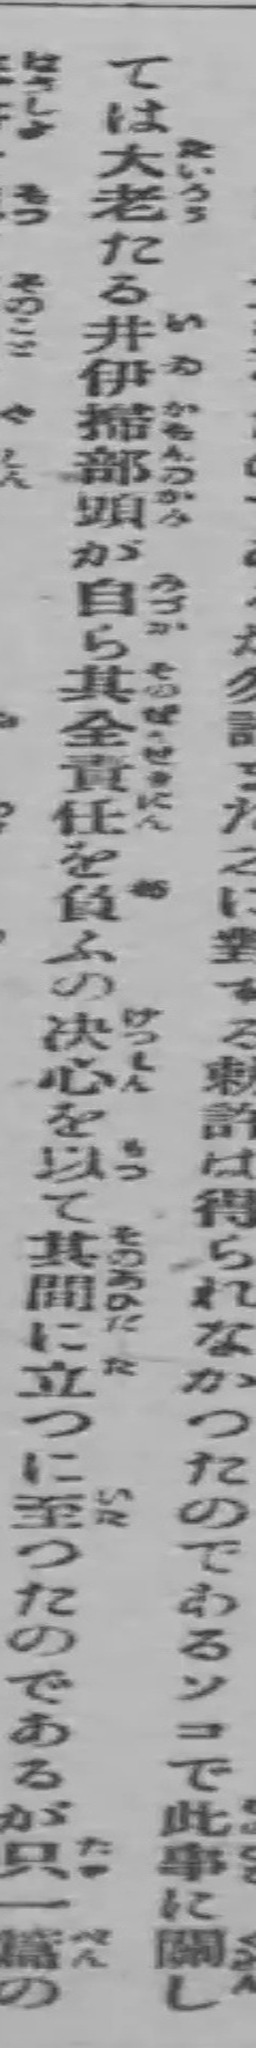ては大老たる井伊掃部頭が自ら其全責任を負ふの決心を以て其間に立つに至つたのであるが只一篇の
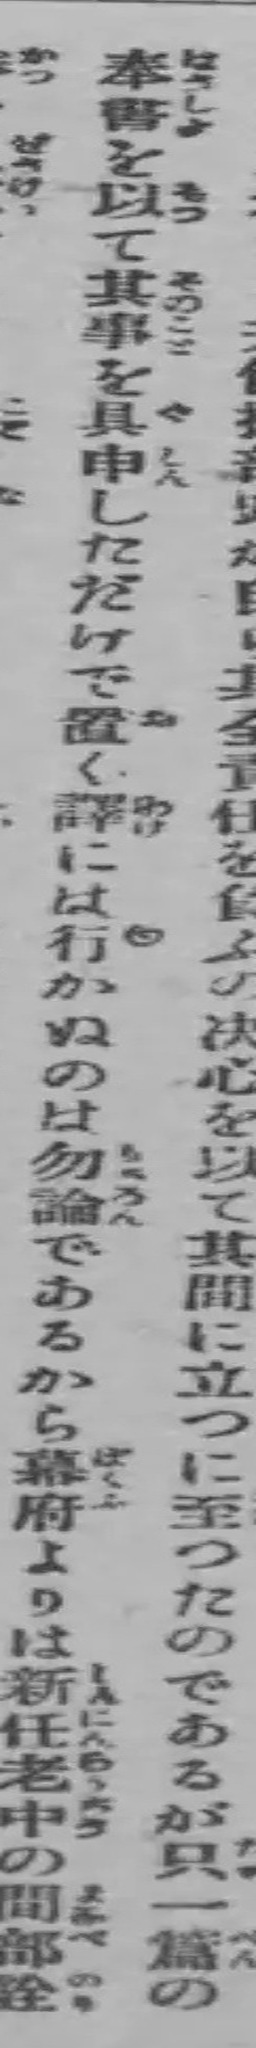奉書を以て其事を具申しただけで置く訳には行かぬのは勿論であるから幕府よりは新任老中の間部詮
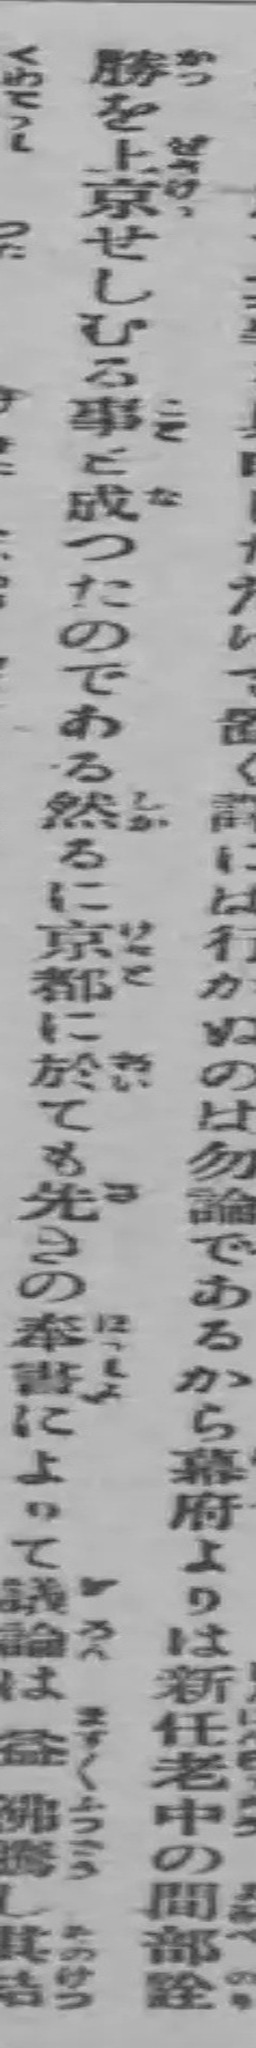勝を上京せしむる事と成つたのである然るに京都に於ても先きの奉書によりて議論は益沸騰し其結
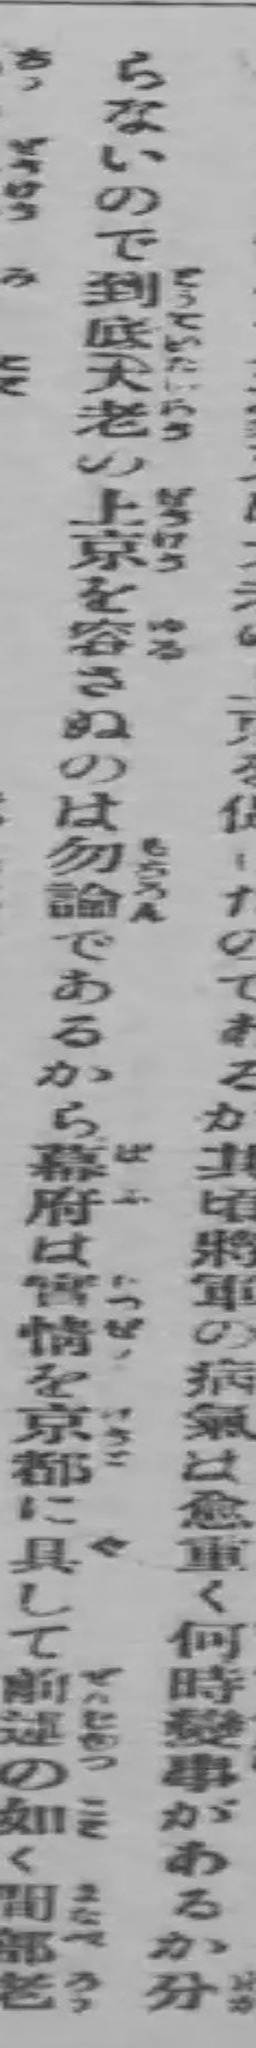らないので到底大老の上京を容さぬのは勿論であるから幕府は実情を京都に具して前述の如く間部老
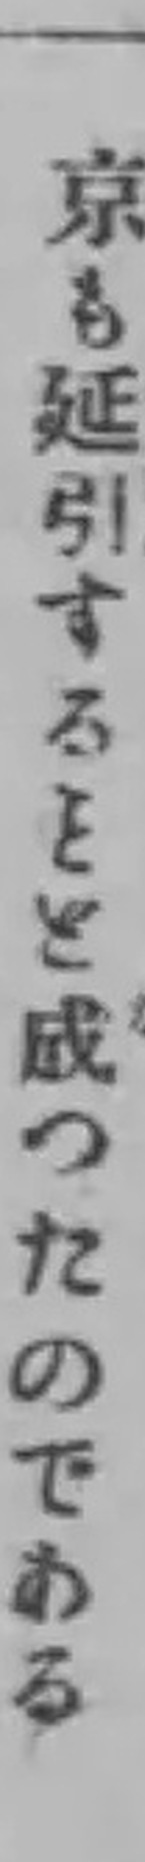京も延引することと成つたのである
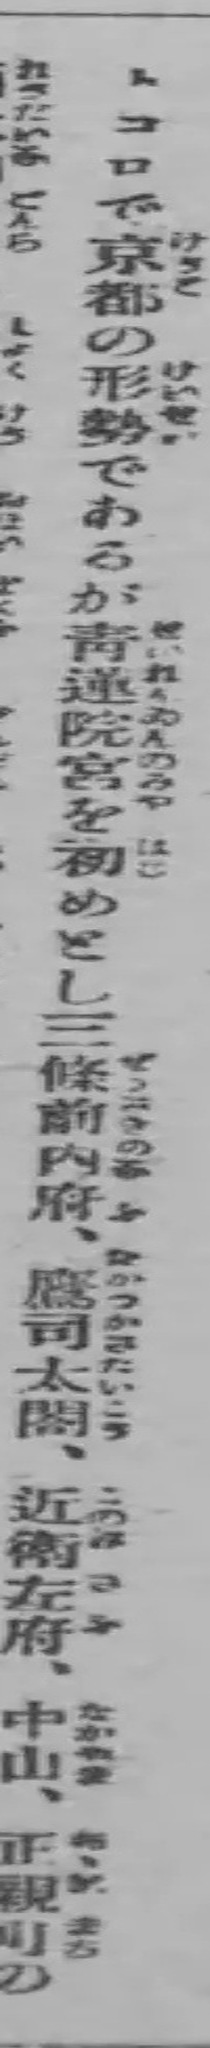トコロで京都の形勢であるが青蓮院宮を初めとし三条前内府、鷹司太閤、近衛左府、中山、正親町の
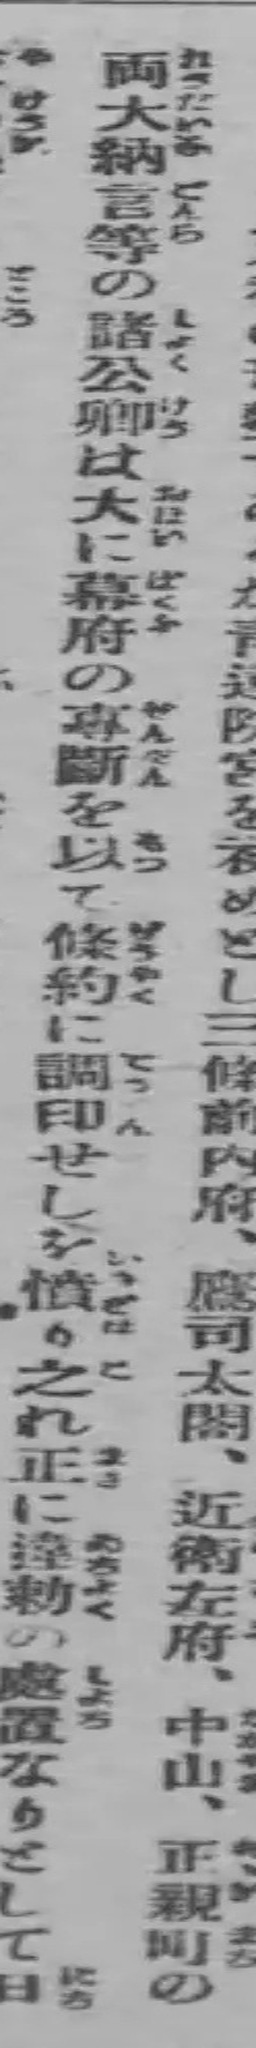両大納言等の諸公卿は大に幕府の専断を以て条約に調印せしを憤り之れ正に違勅の処置なりとして日
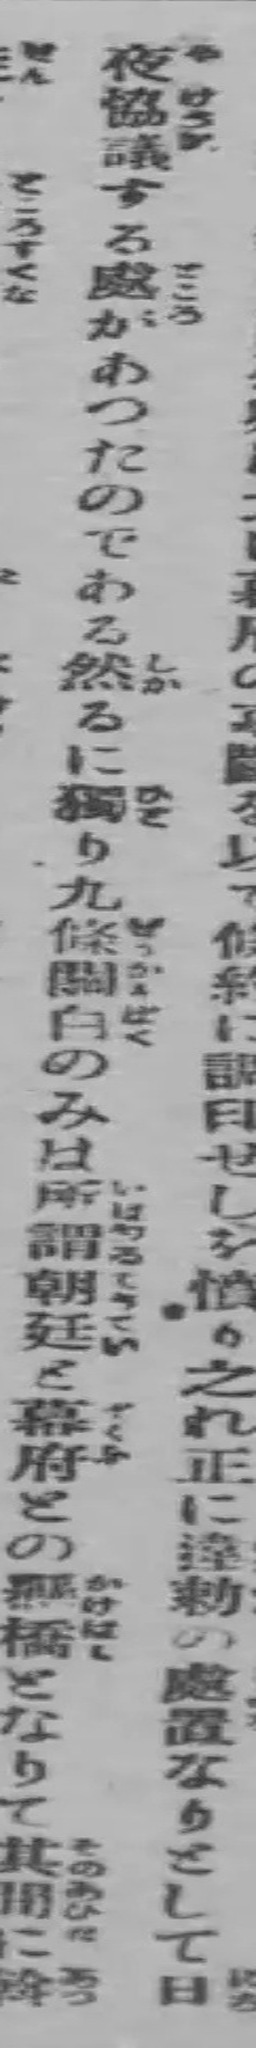夜協議する処があつたのである然るに独り九条関白のみは所謂朝廷と幕府との懸橋となりて其間に斡
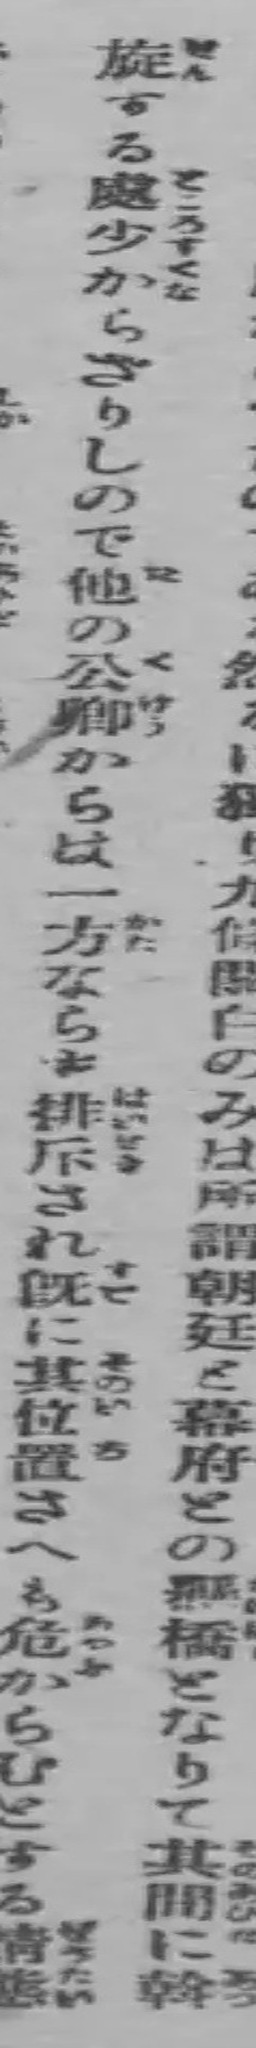旋する処少からざりしので他の公卿からは一方ならず排斥され既に其位置さへも危からむとする情態
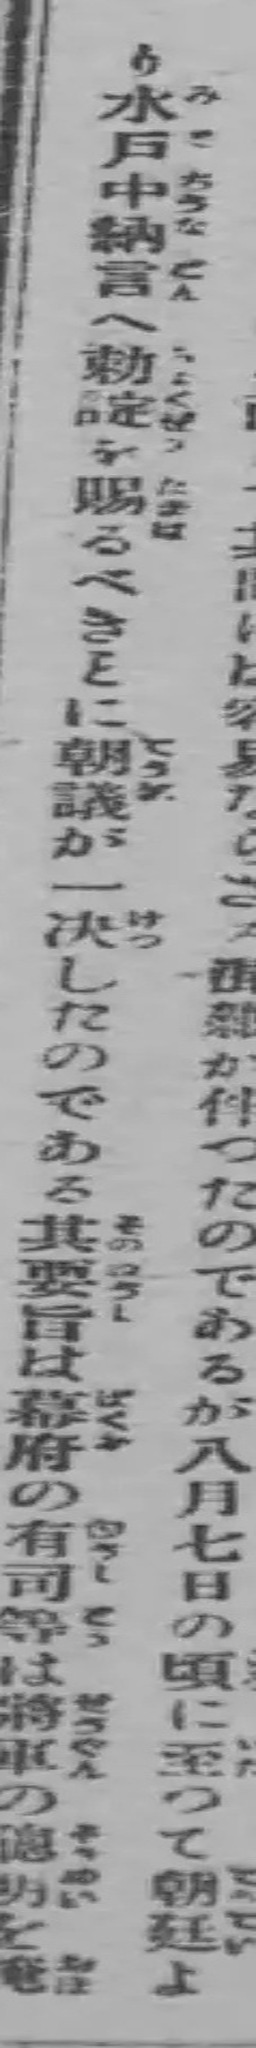り水戸中納言へ勅諚を賜るべきことに朝議が一決したのである其要旨は幕府の有司等は将軍の聡明を掩
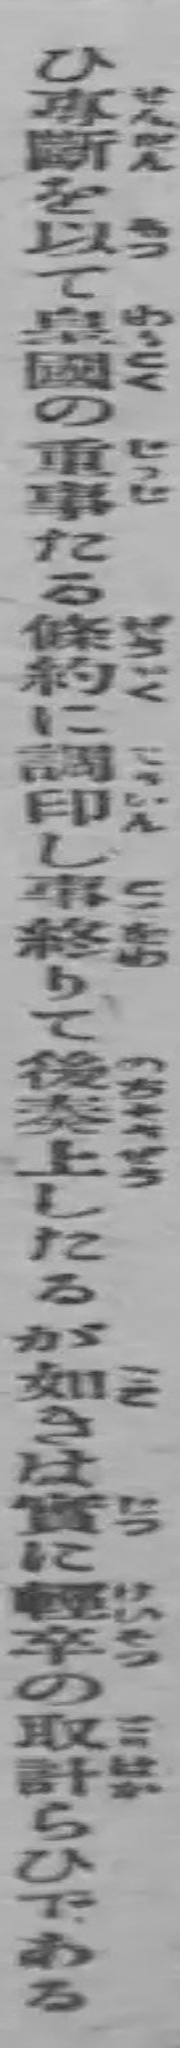ひ専断を以て皇国の重事たる条約に調印し事終りて後奏上したるが如きは実に軽率の取計らひである
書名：豊橋市史談
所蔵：国立国会図書館 National Diet Library, JAPAN
